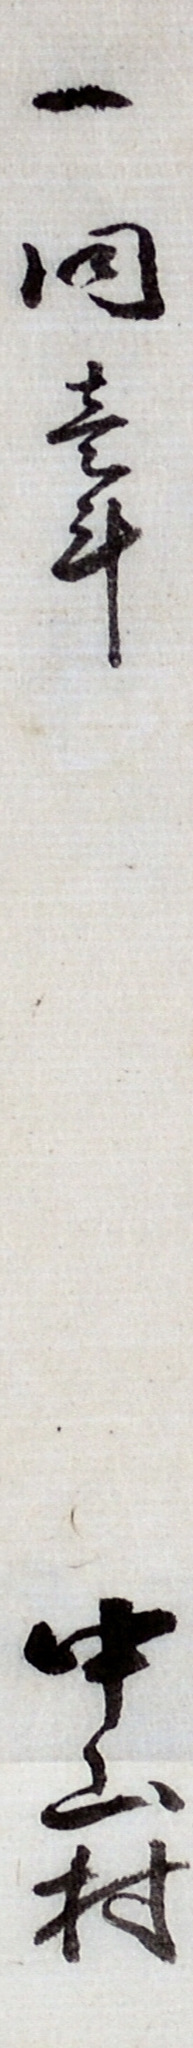一同壱斗中山村
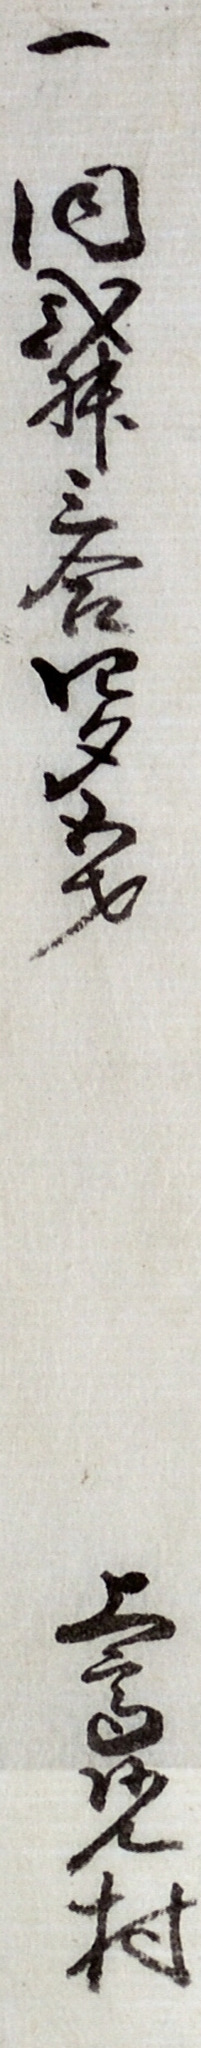一同弐升三合四勺五才上高見村
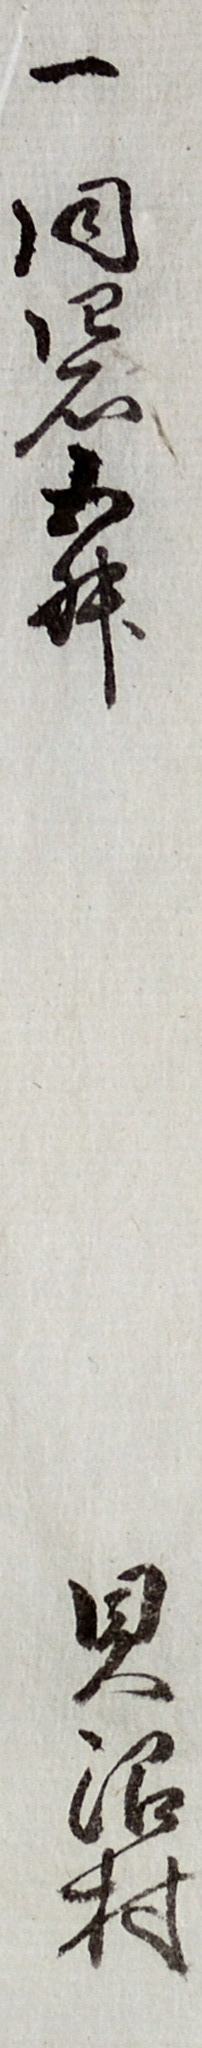一同四石五升貝沼村
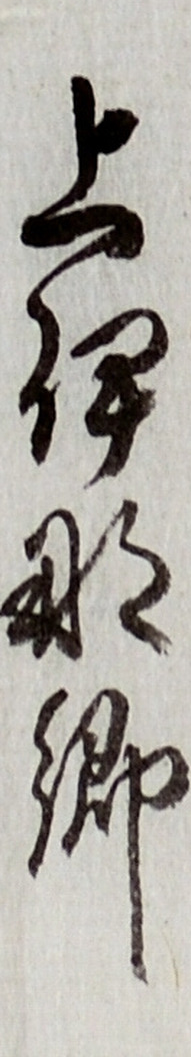上伊那郷
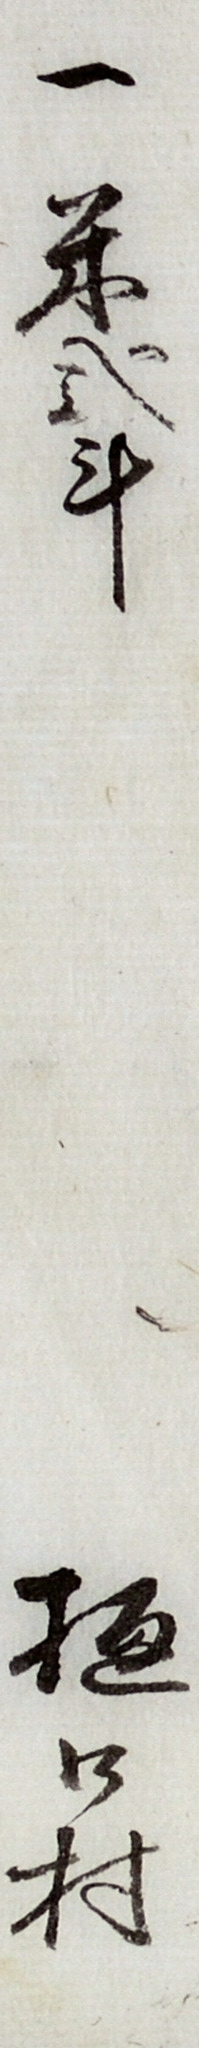一米弐斗樋口村

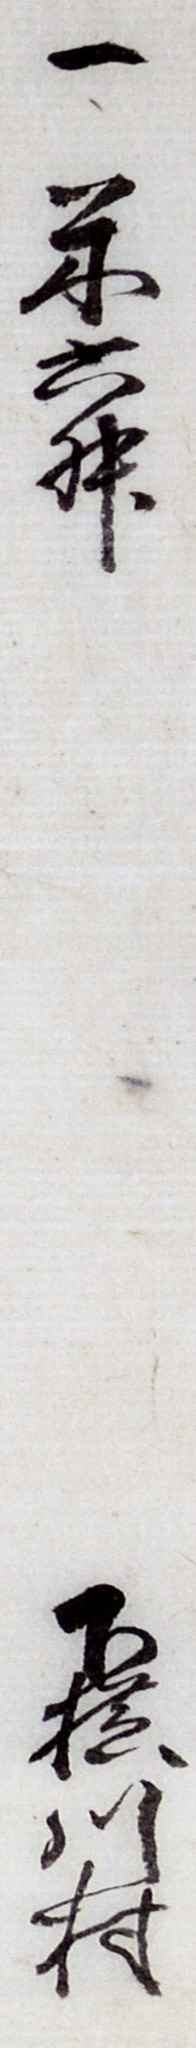一米六升下横川村
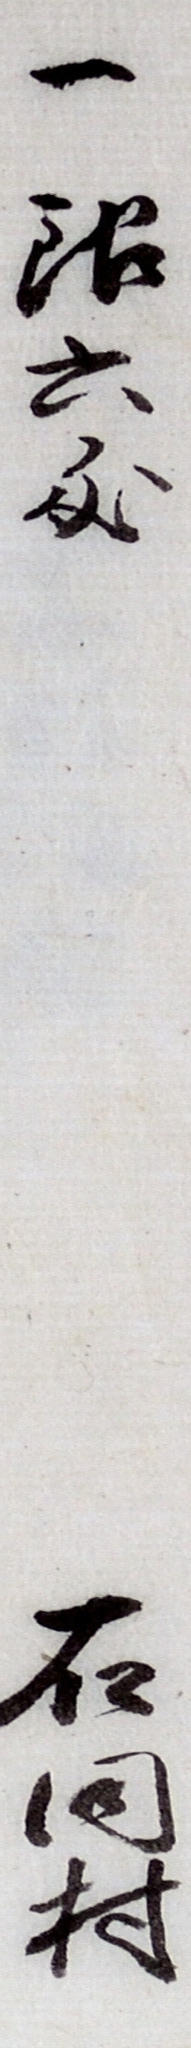一銀六匁右同断
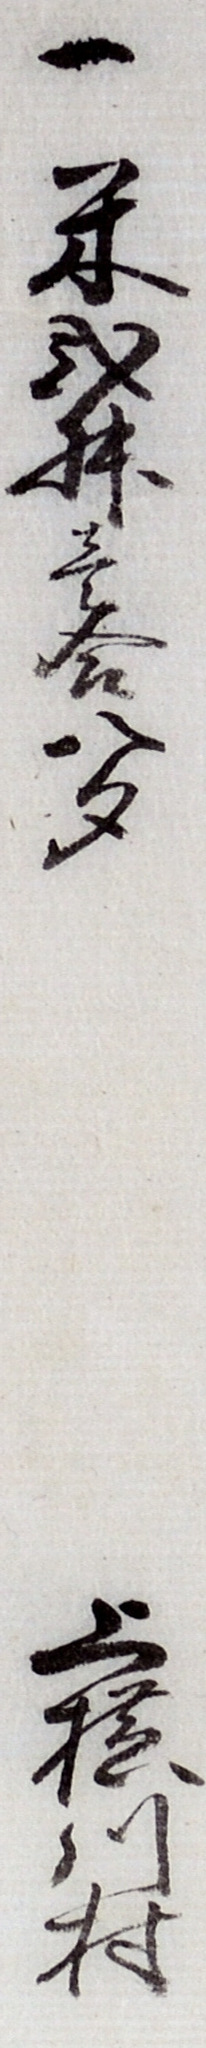一米弐升壱合八勺上横川村
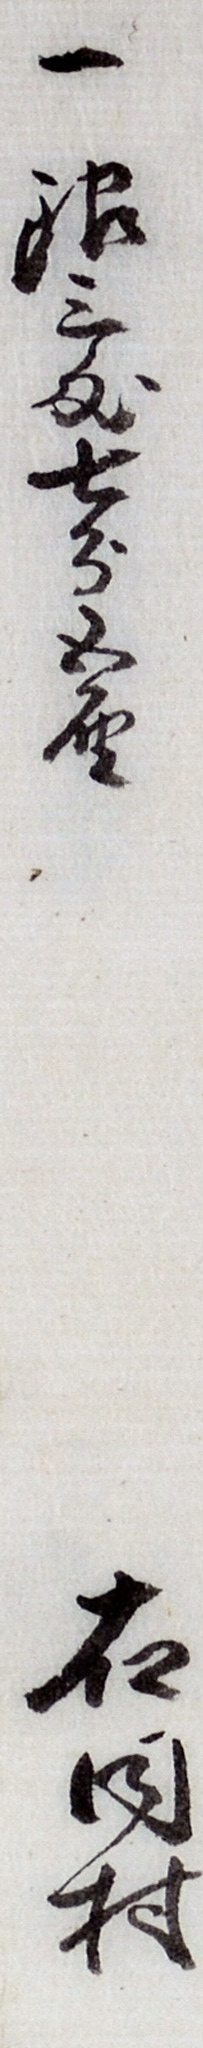一銀三匁七分五厘右同断
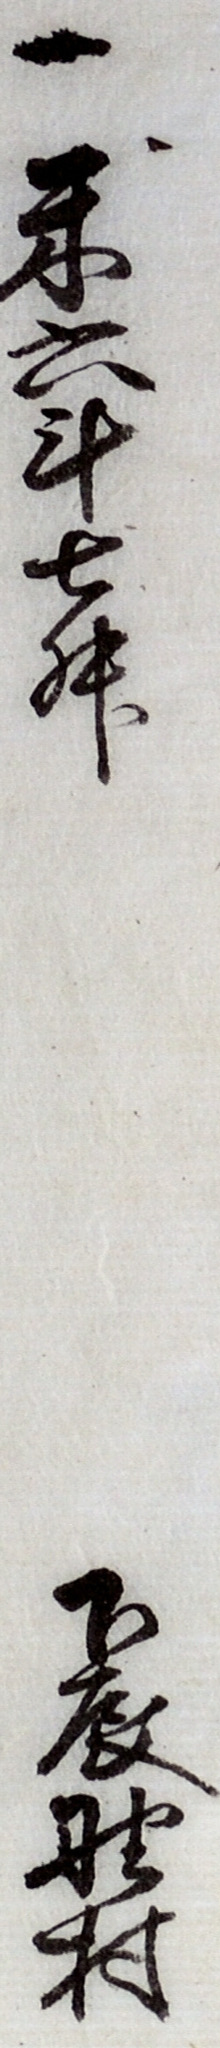一米六斗七升下辰野村
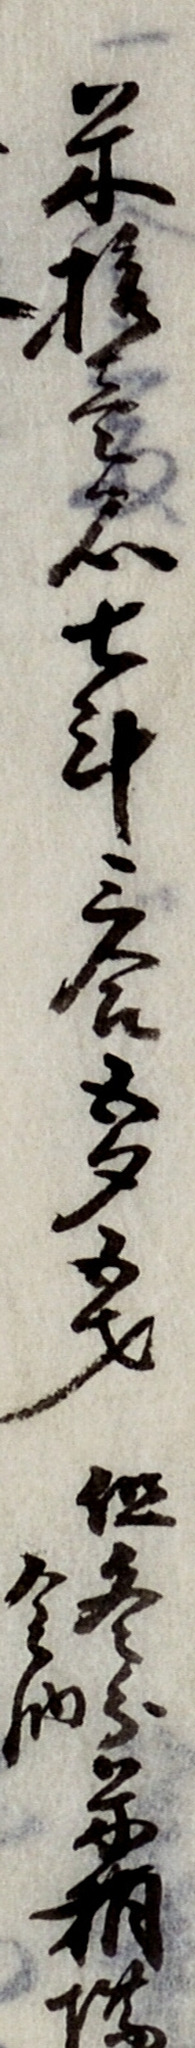〆米拾壱石七斗三合五勺五才但冬分米相場ニ而
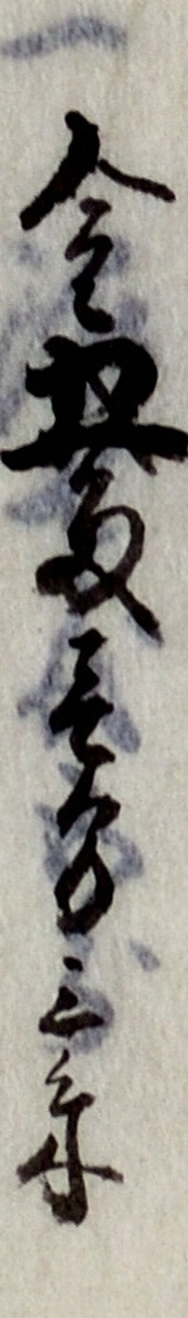金五両壱分三朱金納
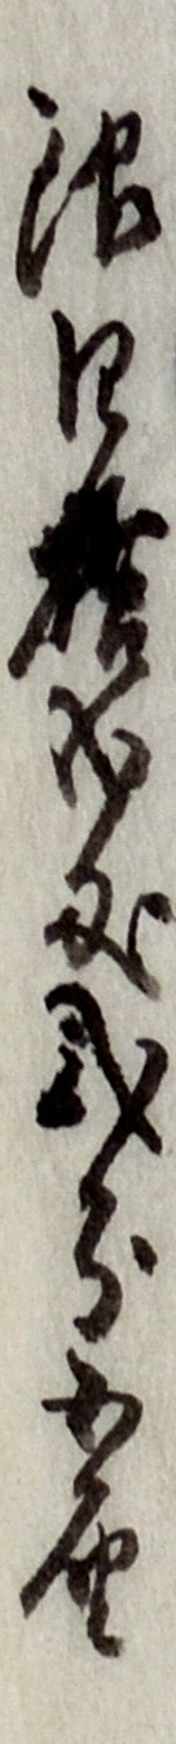銀四拾弐匁弐分五厘
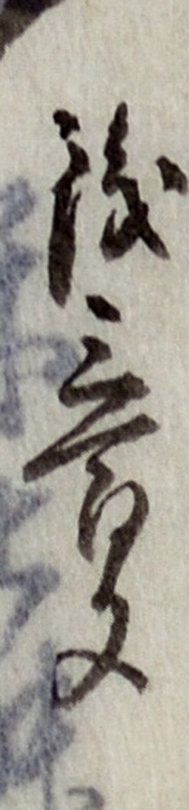銭三百文

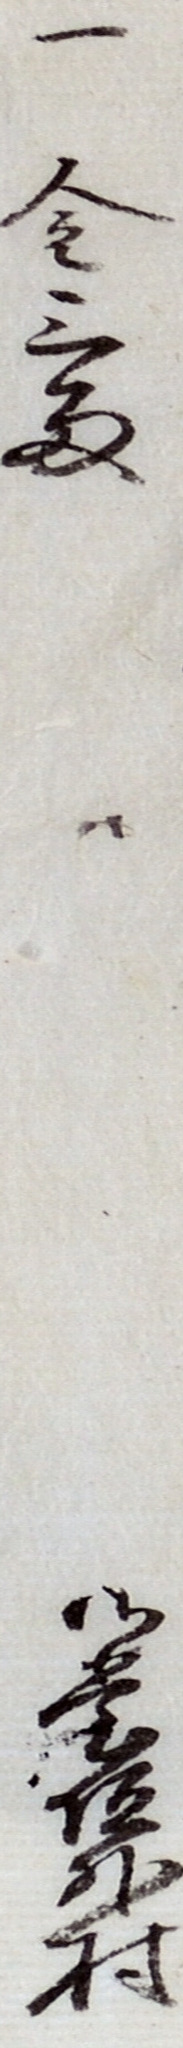一金三両御堂垣外村
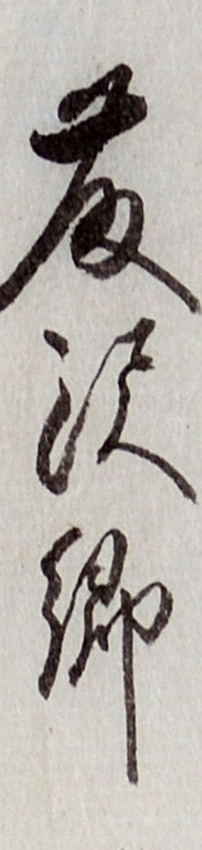藤沢郷
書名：官林下草御山代取立帳
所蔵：伊那市立高遠町図書館・合同会社AMANE
